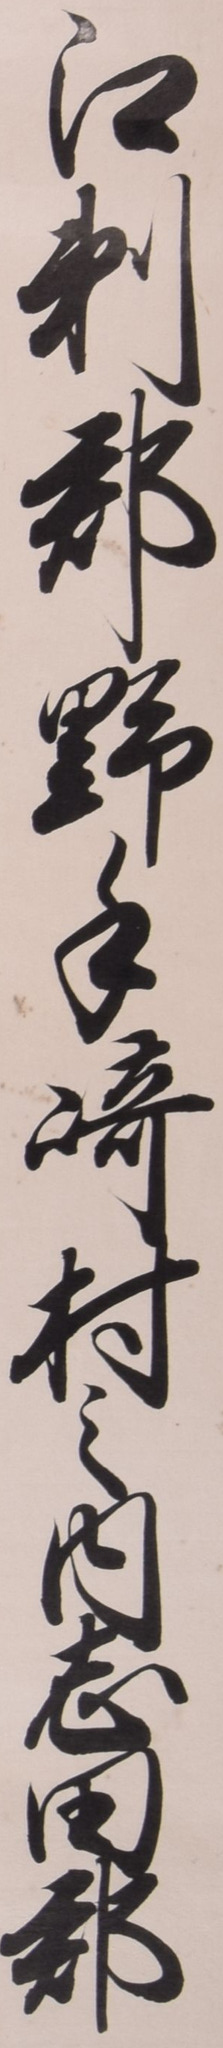江刺郡野手崎村之内志田郡
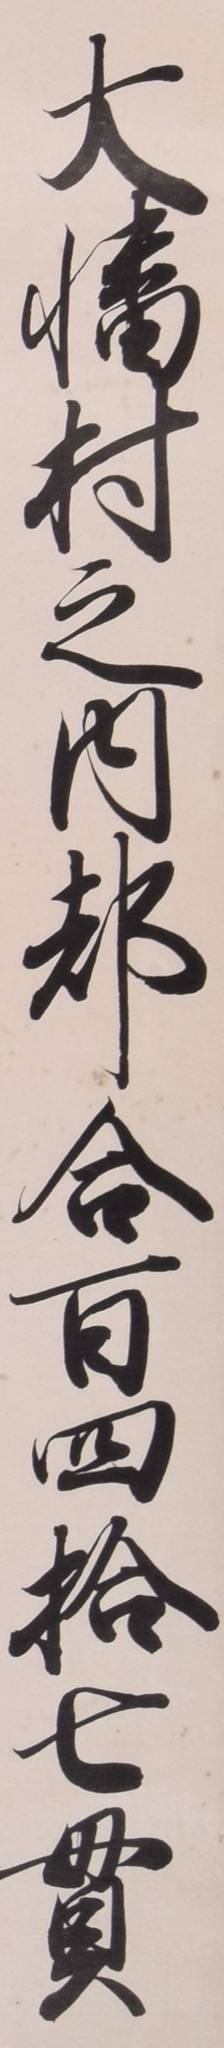大幡村之内都合百四拾七貫
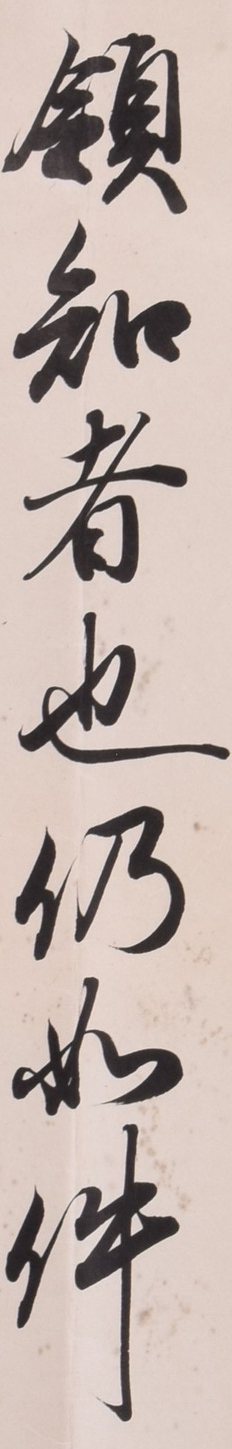領知者也仍如件
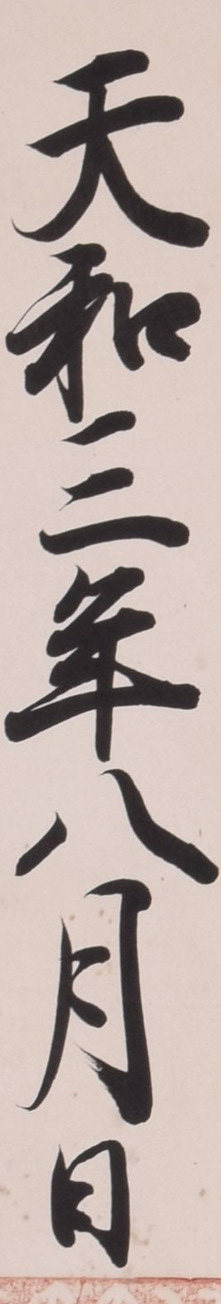天和三年八月日
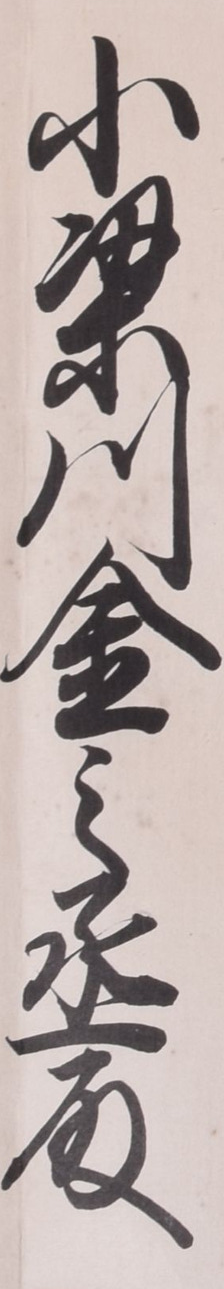小梁川金之丞殿
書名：（知行状）
